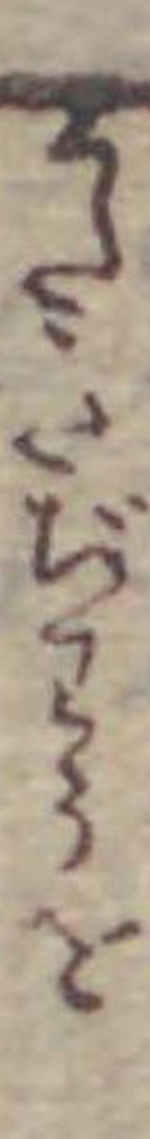かたきぢわうを
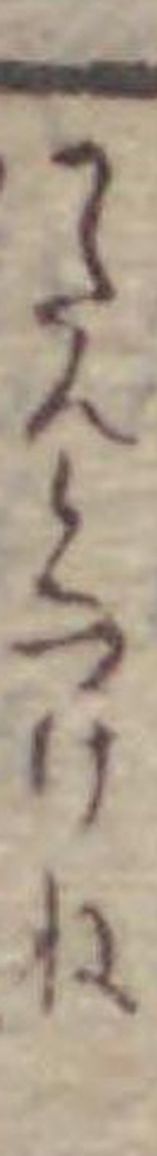うたんとつけね
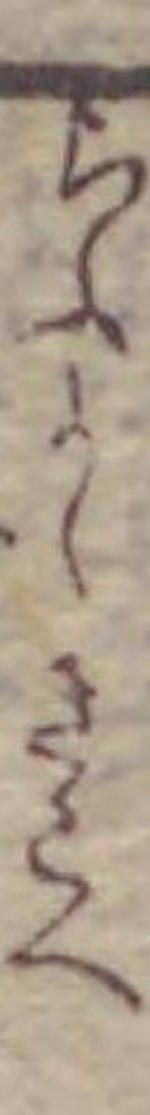らふよくきこへ
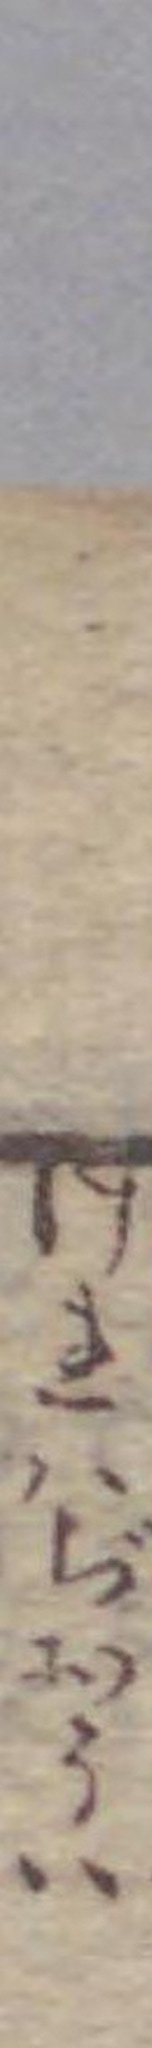けれはぢおうは
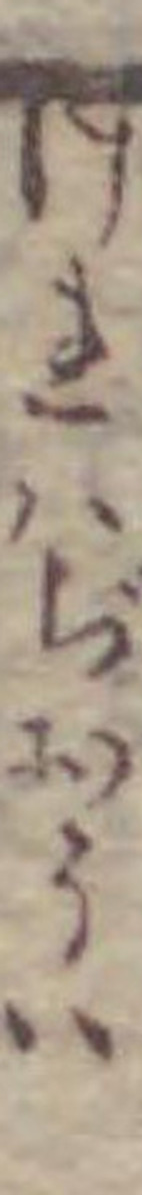けれはぢおうは
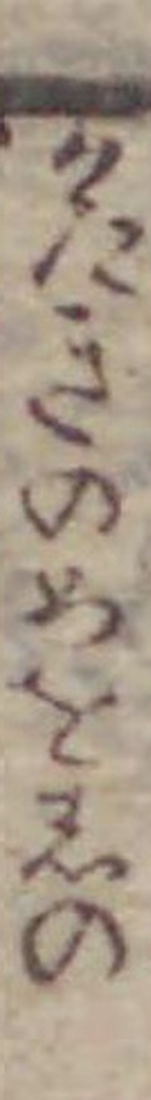かたきのめをしの
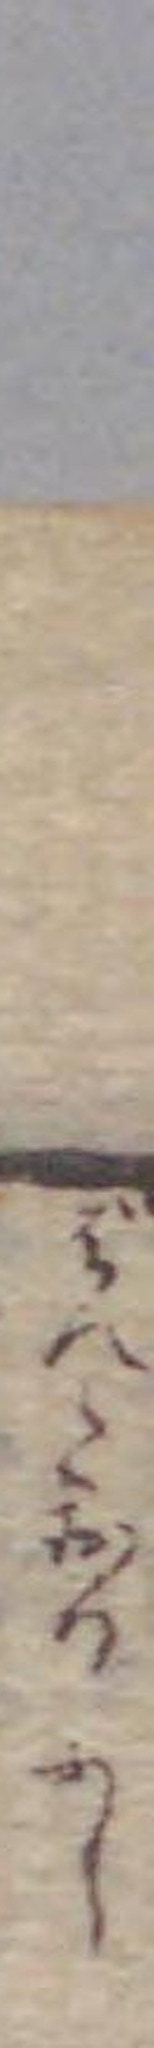ばんとおりふし
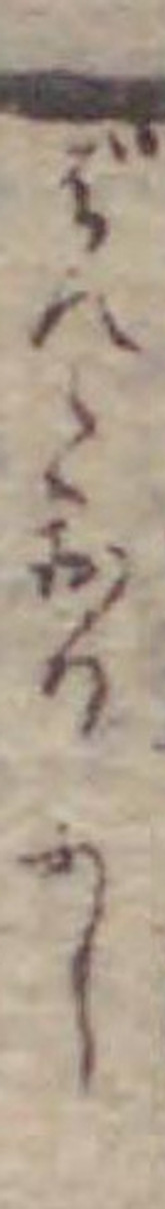ばんとおりふし
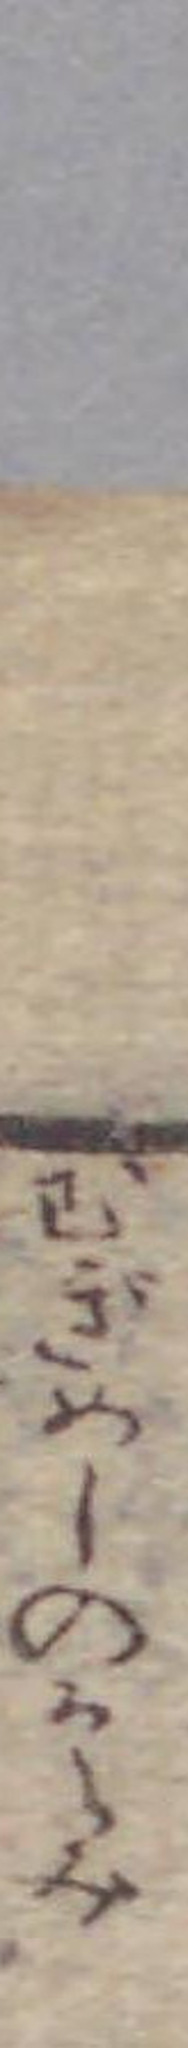むぎめしのからみ
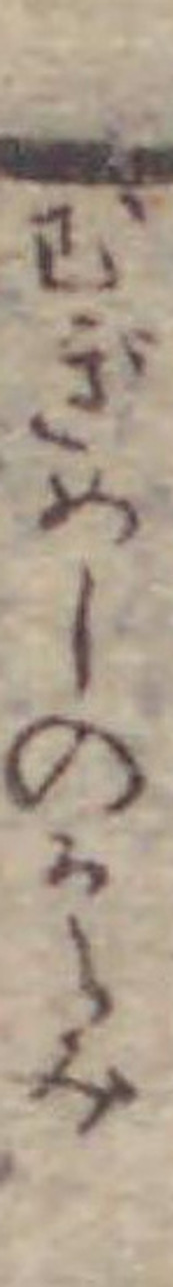むぎめしのからみ
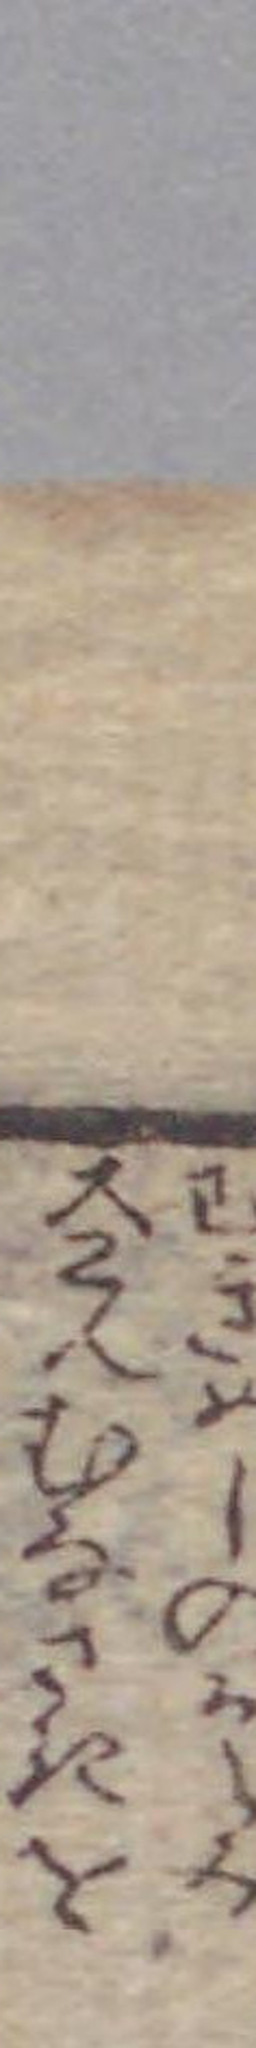大こんむなさきを
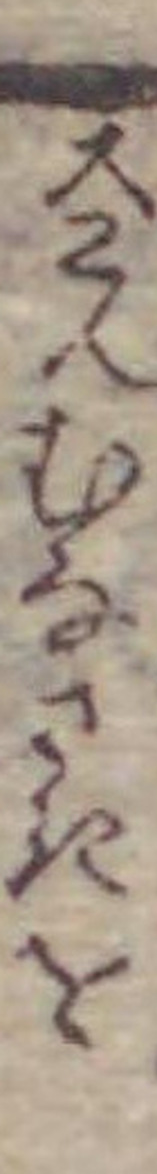大こんむなさきを
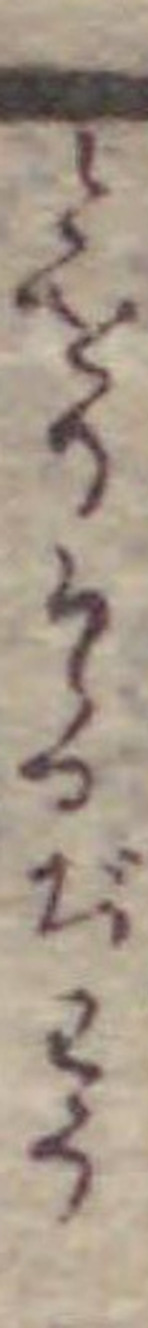とをりかゝるぢわう
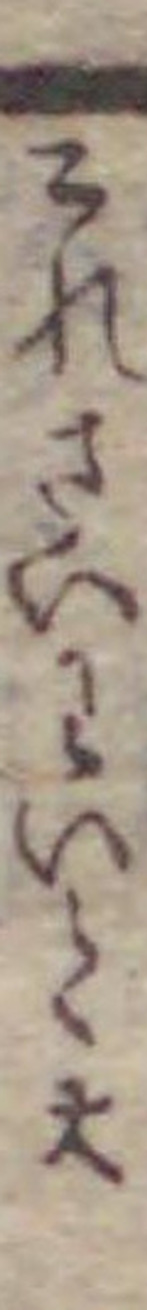これさいわいと大
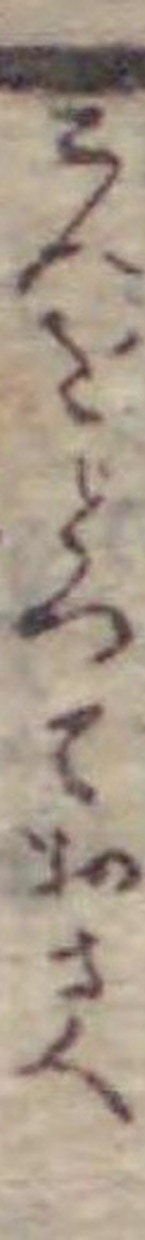こんをとつておさへ
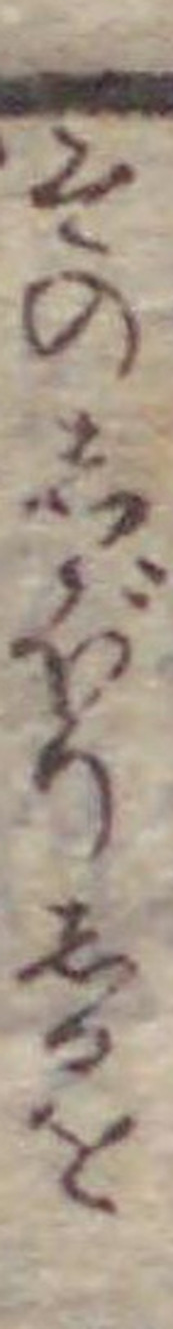そのしぼりしるを
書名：鼻下長生薬 : 3巻
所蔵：国立国会図書館 National Diet Library, JAPAN
